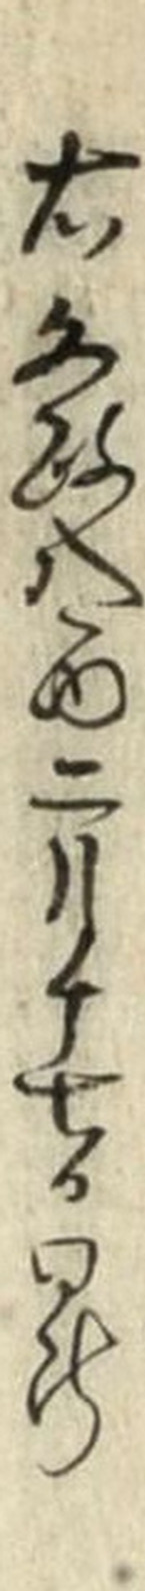右文政八酉二月十七日同断
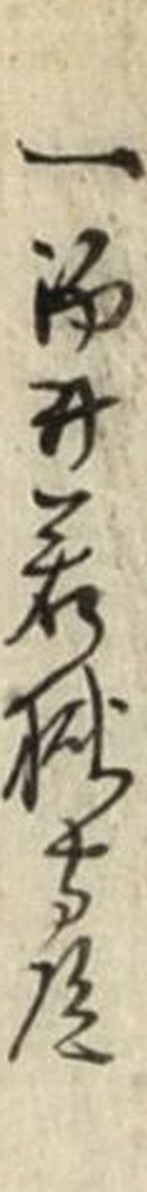一酒井若狭守殿
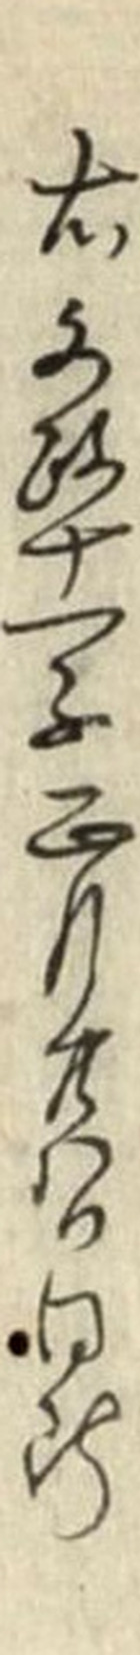右文政十一子正月廿八日同断
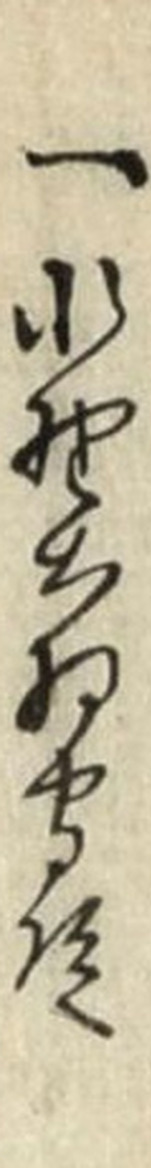一水野出羽守殿
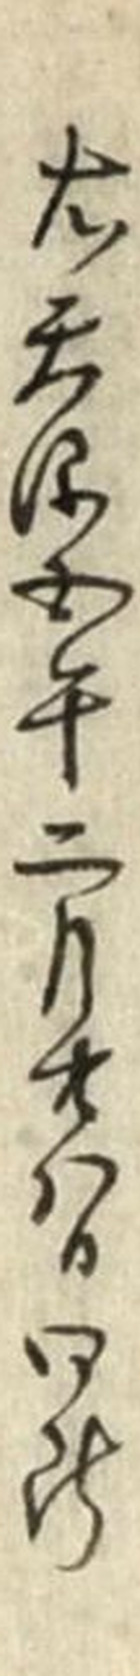右天保五午二月廿八日同断
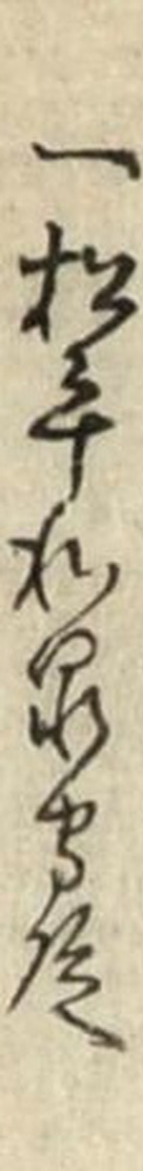一松平和泉守殿
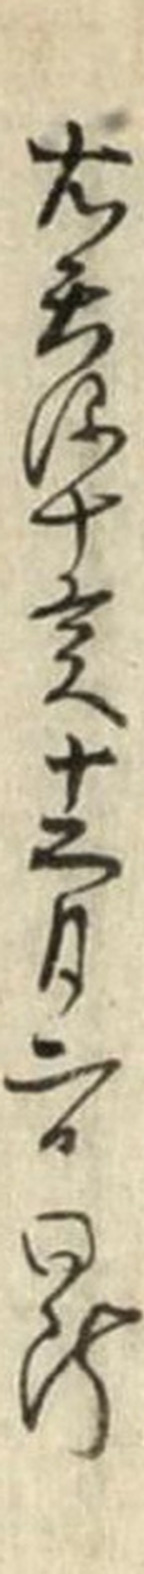右天保十亥十二月二日同断
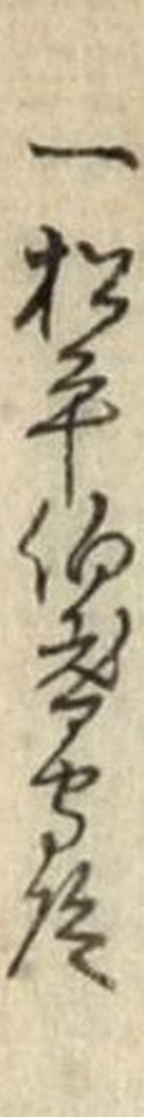一松平伯耆守殿
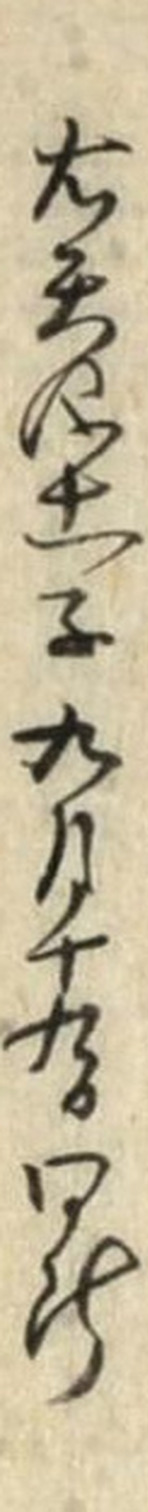右天保十一子九月十九日同断

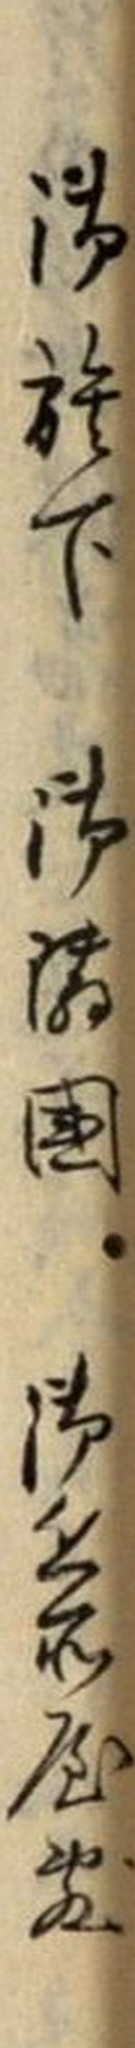御旗下御隣国御近所屋敷
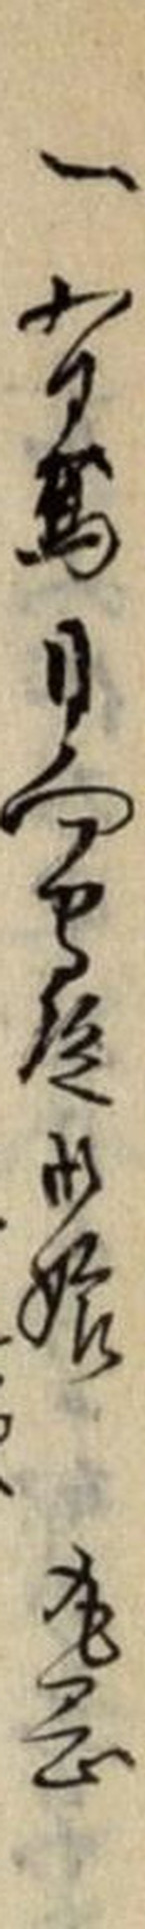一有馬日向守殿御娘丸岡
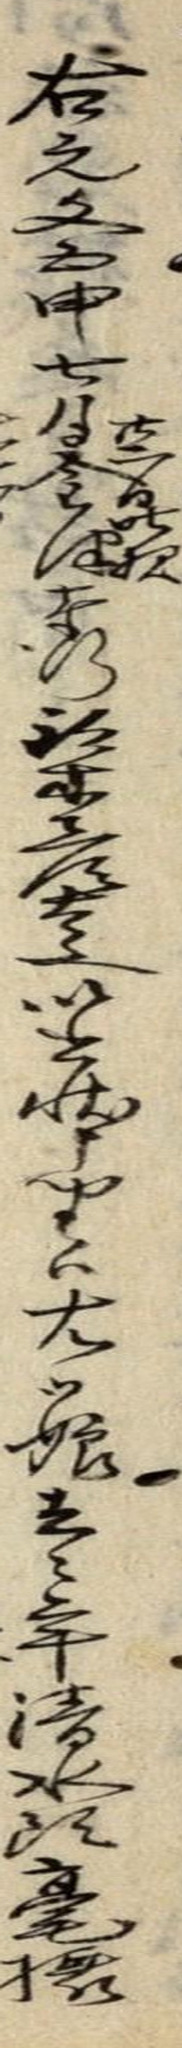右元文五申七月◦廿二日昨夜金津奉行鈴木彦大夫以書状申聞候は右御娘去々年清水頭毫摂
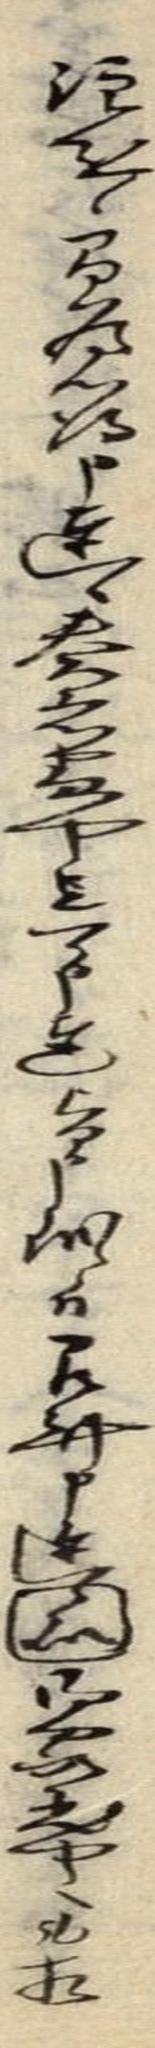注進候間為心得申達候奏者番中迄可申達旨申越候に付即刻申達候処御家中へも相
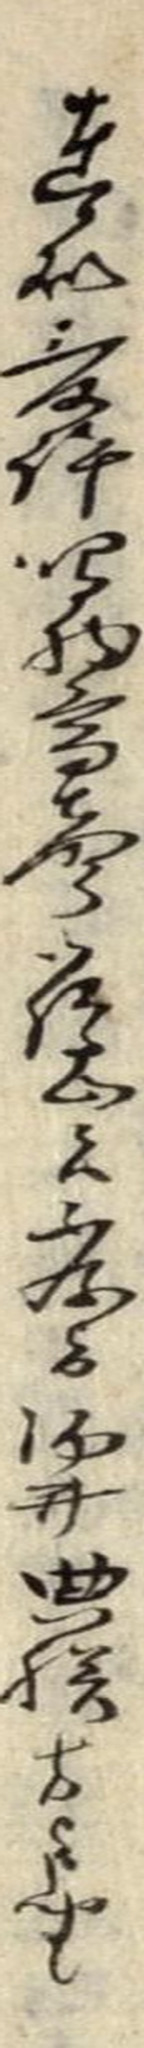達候処爰許鳴物高声御停止には不及旨酒井典膳方被申聞候
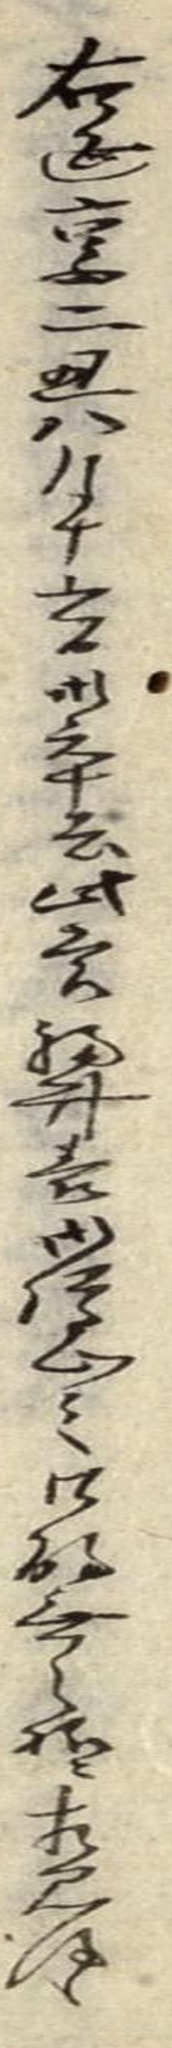右延享二丑八月十六日御卒去此節福井表御停止之口触無之様に相見得候
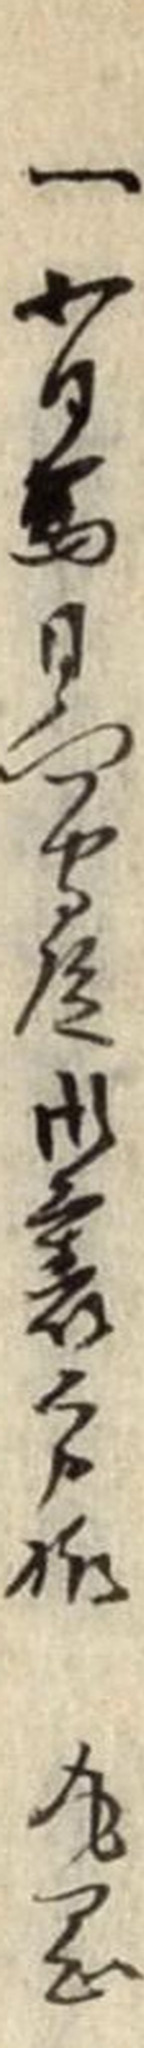一有馬日向守殿御裏方様丸岡
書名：御停止異変死失
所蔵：福井県文書館 Fukui Prefectural Archives
